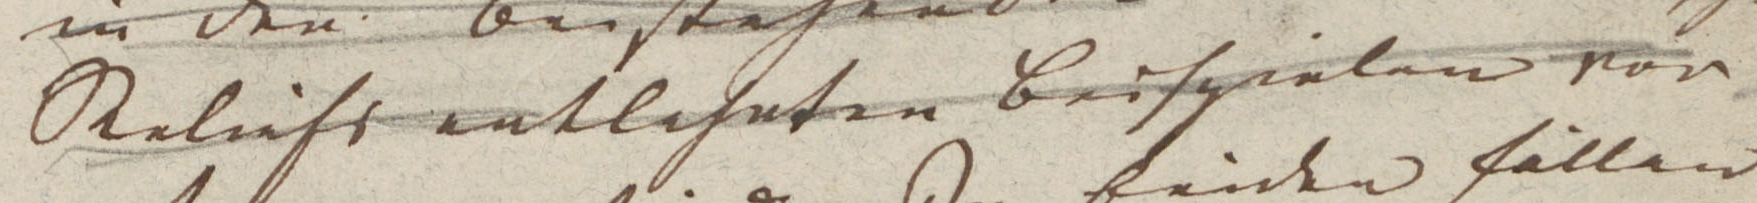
Reliefs entlehnten Beispielen vor
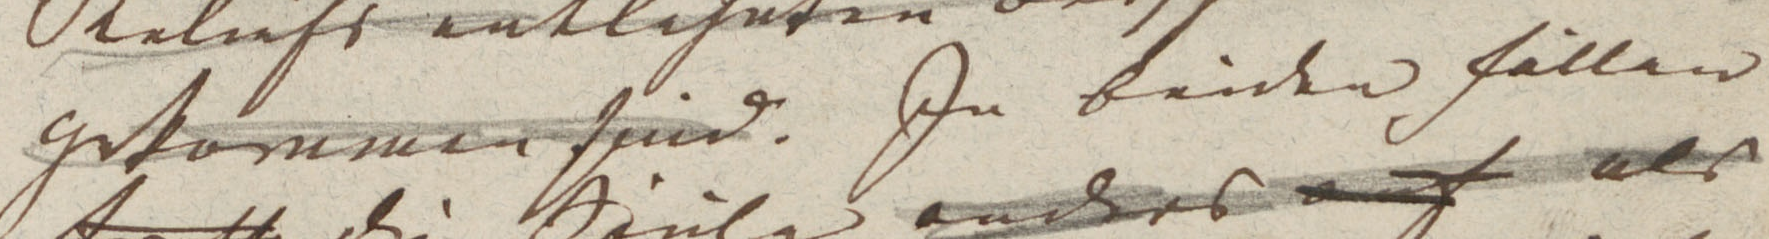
gekommen sind. In beiden Fällen
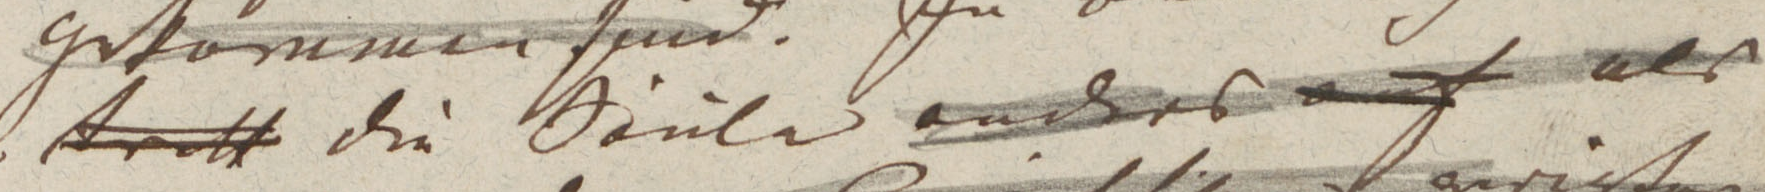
tritt die Säule anders auf als
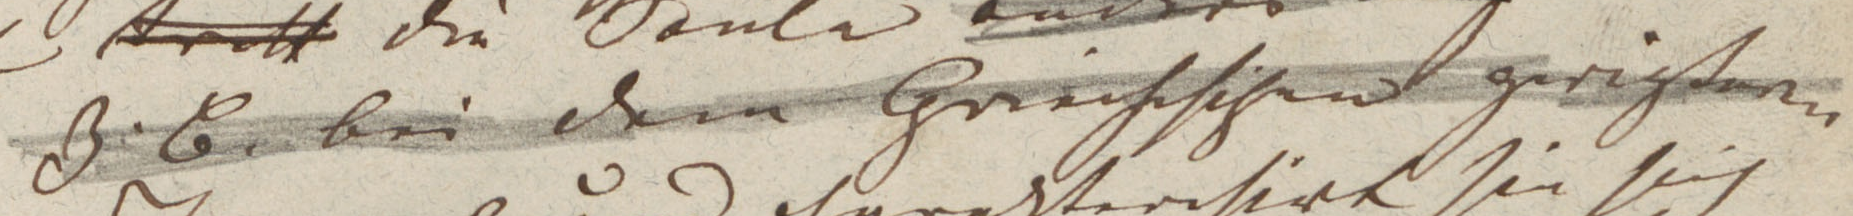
z. B. bei dem Griechischen peripteren
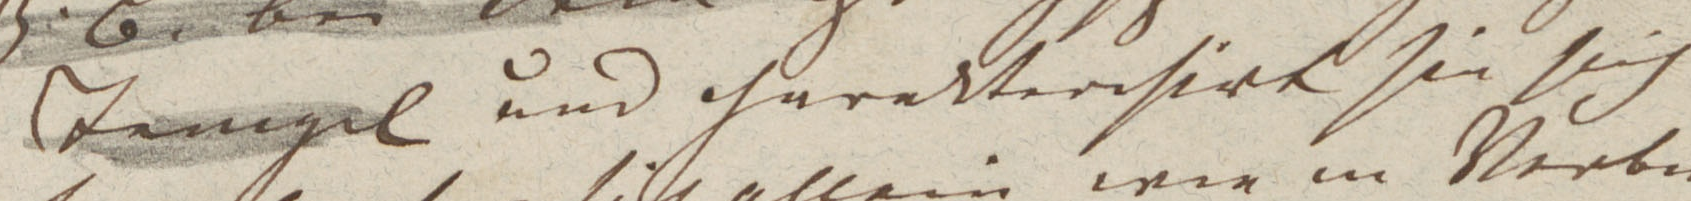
Tempel und charakterisirt sie sich
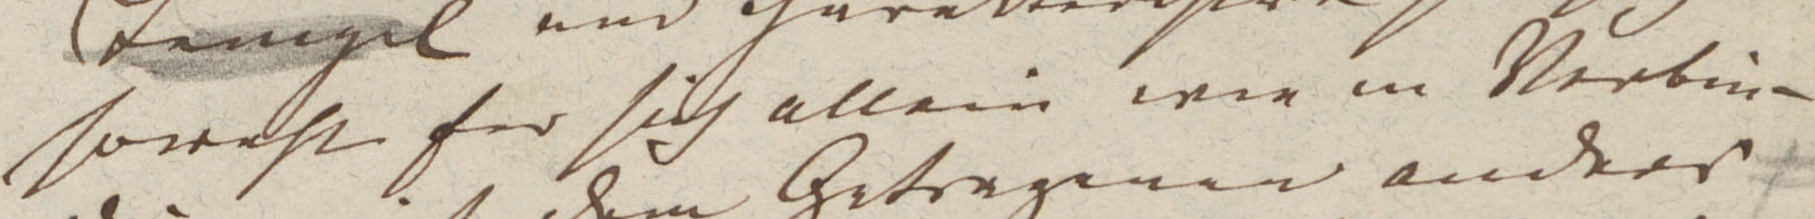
sowohl fur sich allein wie in Verbin-
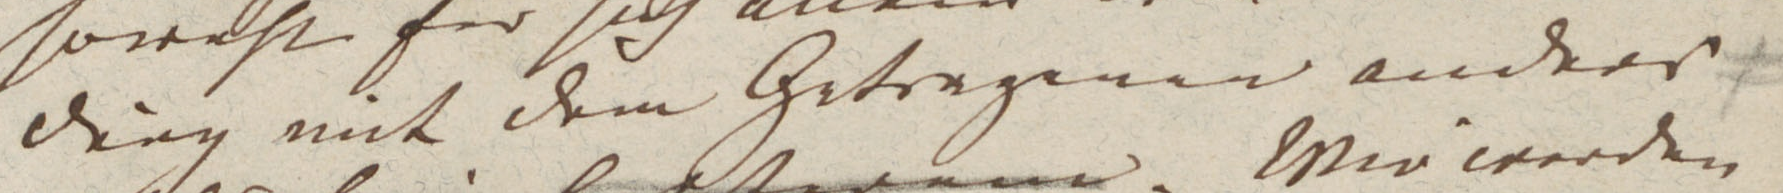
dung mit dem Getragenen anders %
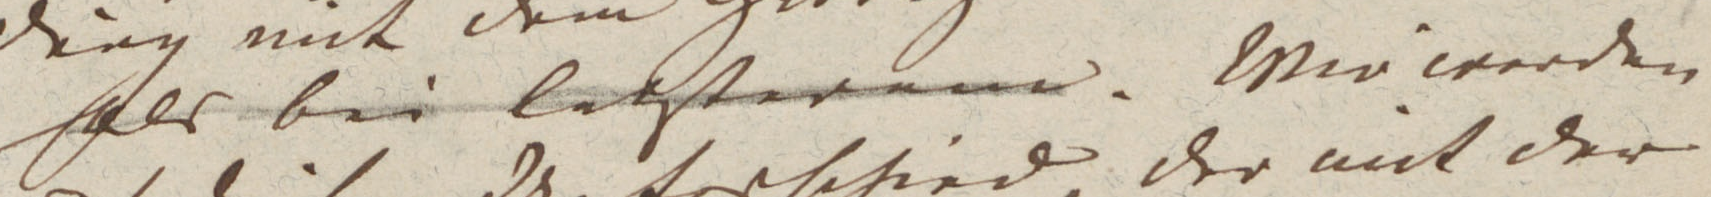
als bei letzterem. Wir werden
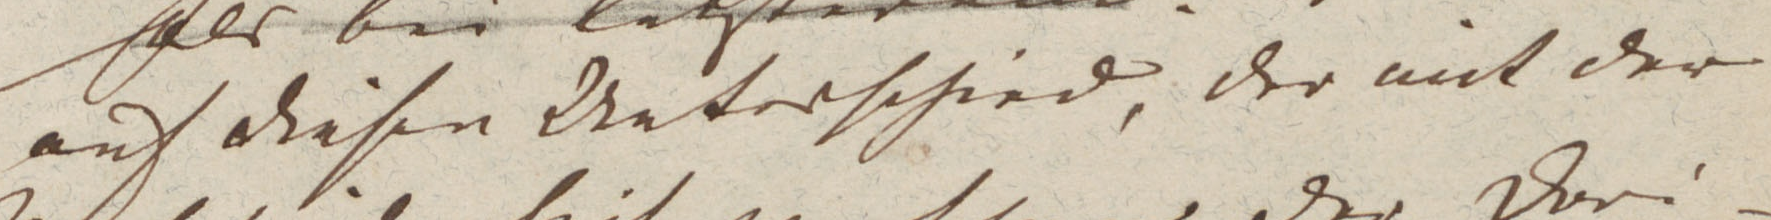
auf diesen Unterschied, der mit der
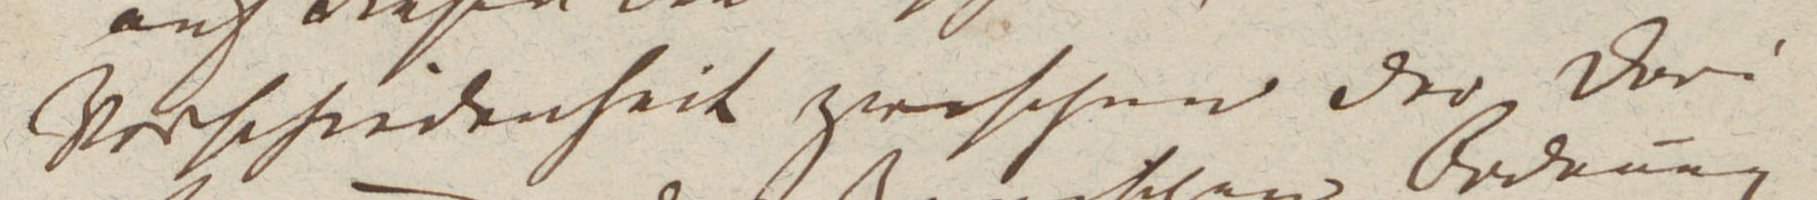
Verschiedenheit zwischen der Dori-
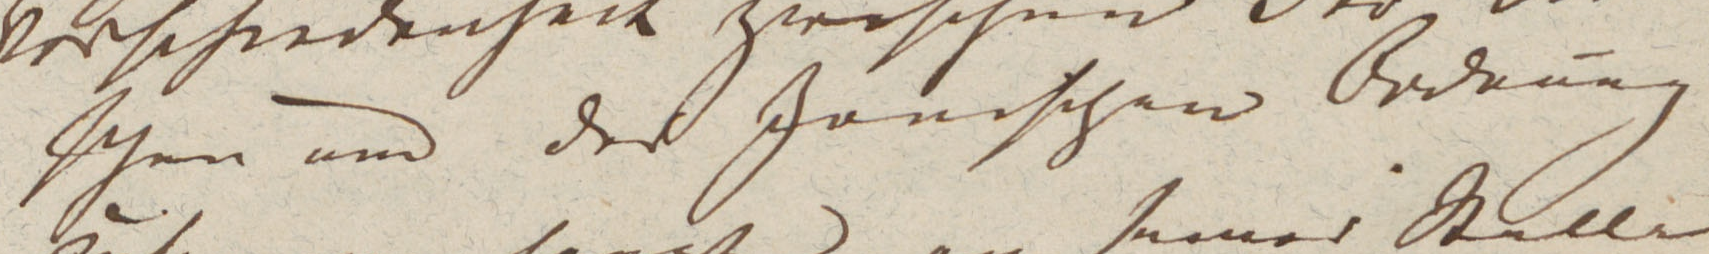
schen und der Ionischen Ordnung
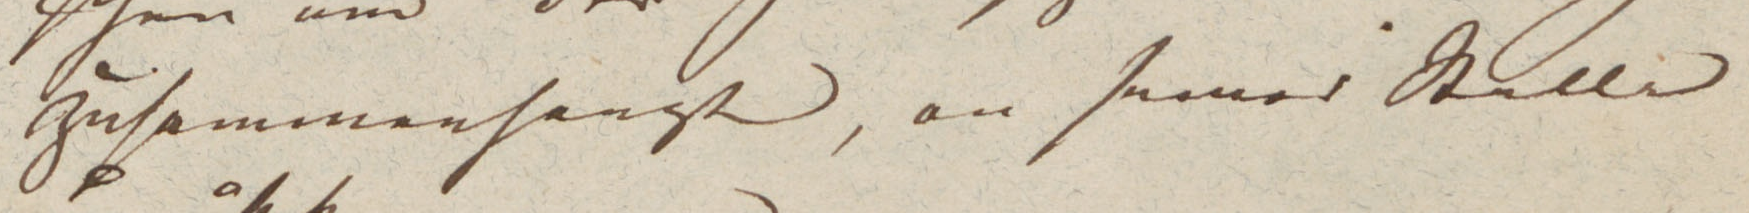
zusammenhangt, an seiner Stelle
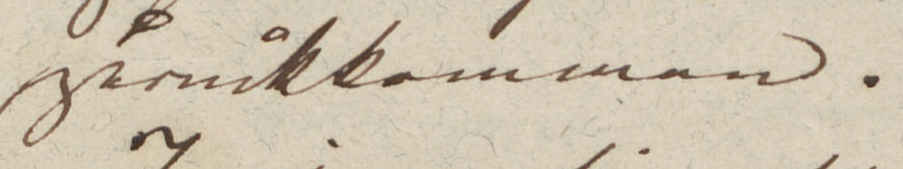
zurückkommen.
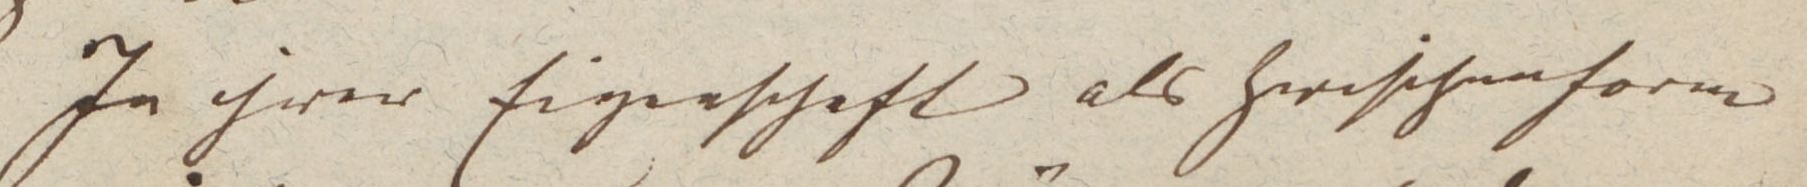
In ihrer Eigenschaft als Zwischenform
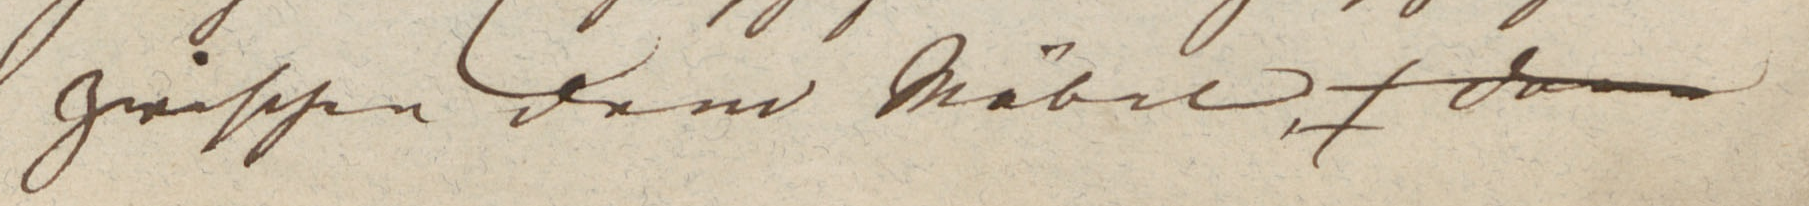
zwischen dem Möbel, (dem
